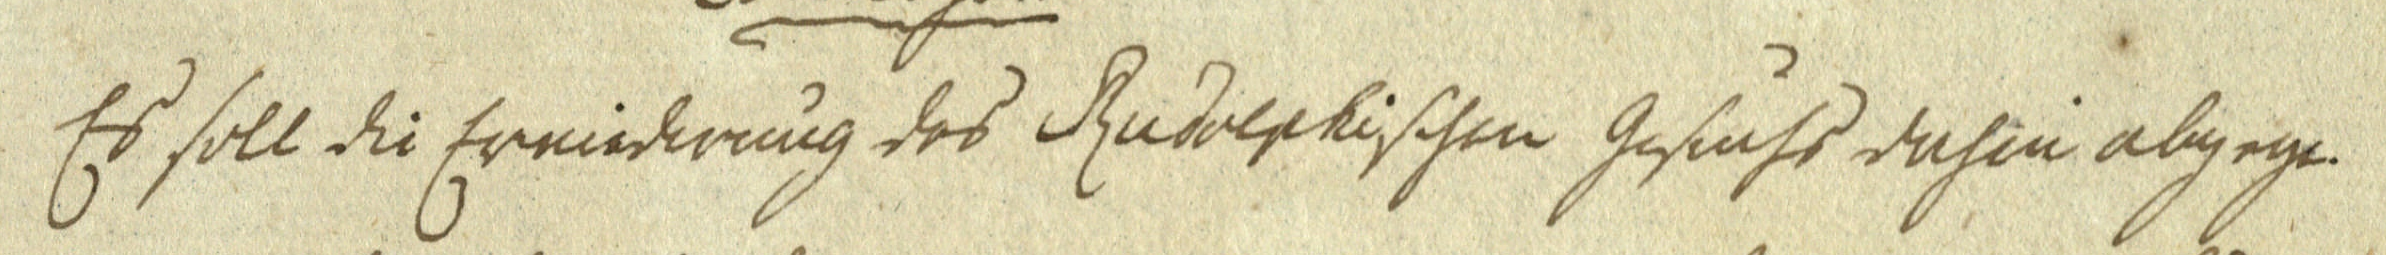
Es soll die Erwiederung des Rudolphischen Gesuchs dahin abgege¬
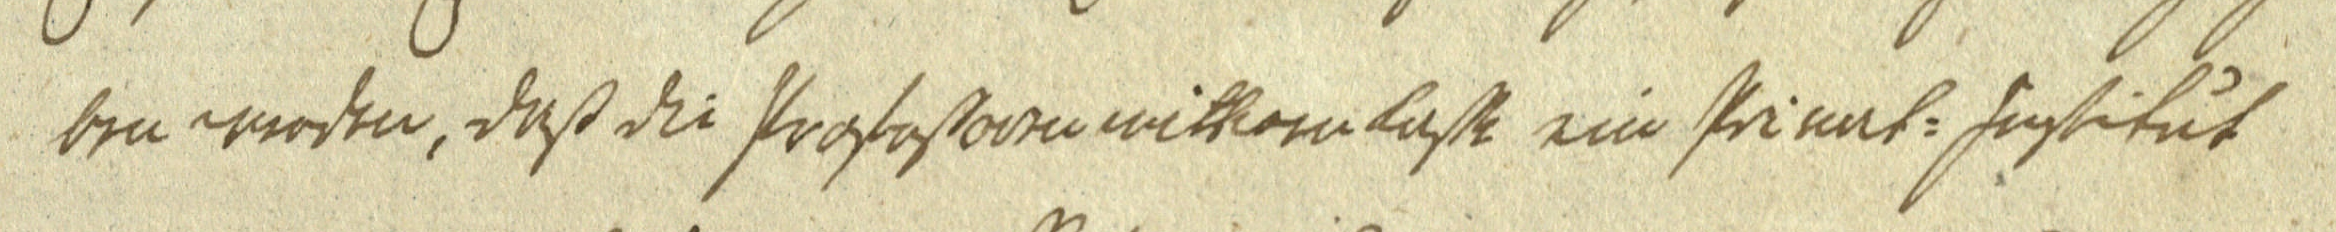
ben werden, daß die Professorenwittwenkasse ein Privat-Institut
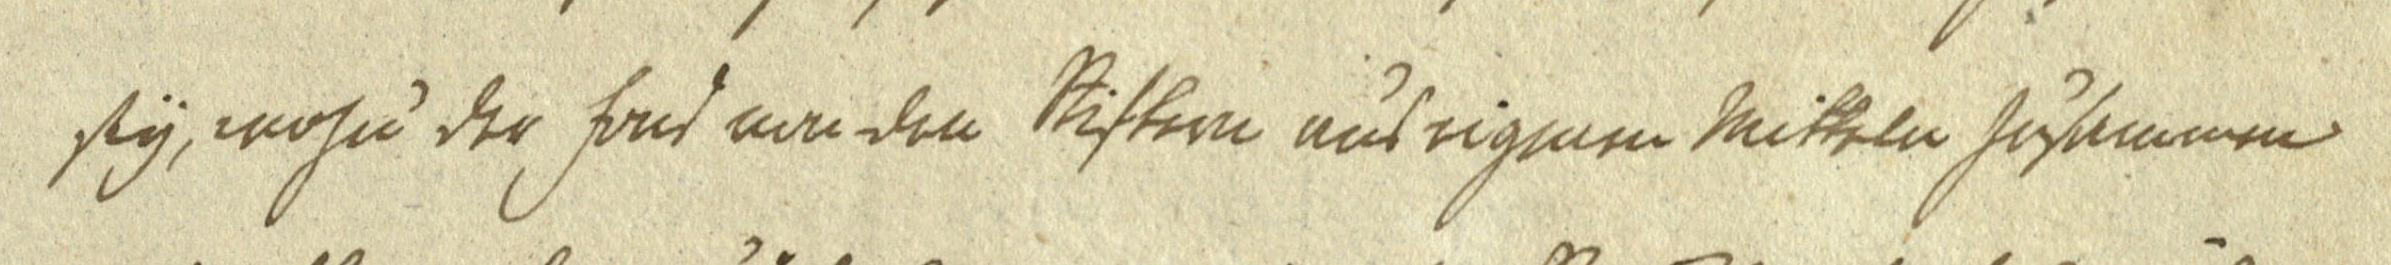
seÿ, wozu der Fond von den Stiftern aus eigenen Mitteln zusammen
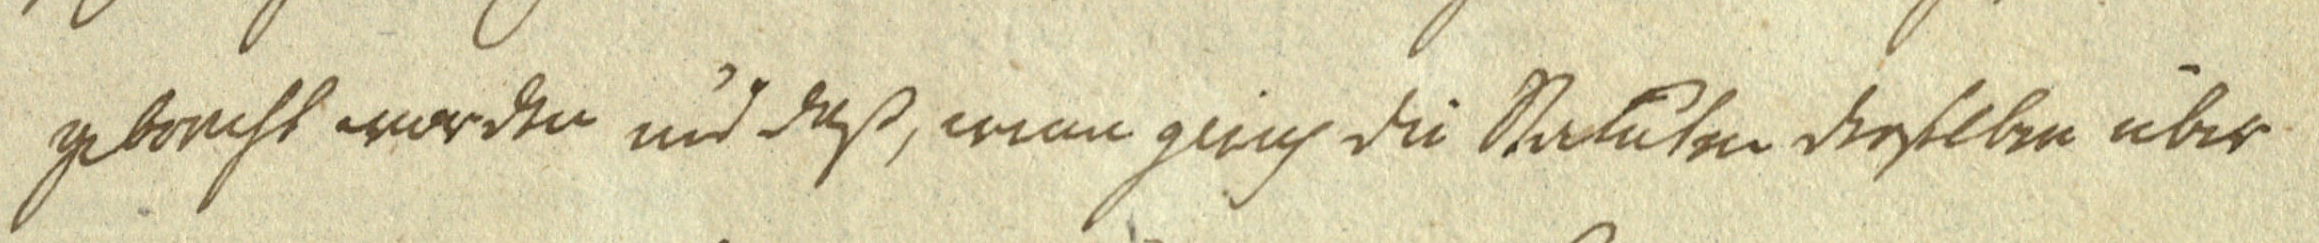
gebracht worden und daß, wenn gleich die Statuten derselben über
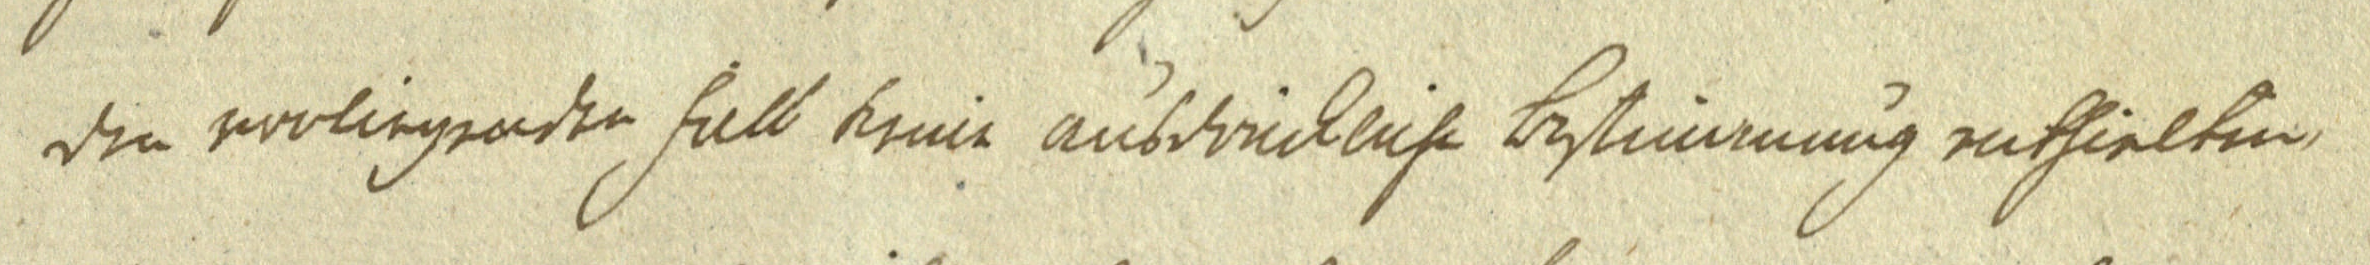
den vorliegenden Fall keine ausdrücklich Bestimmung enthielten,
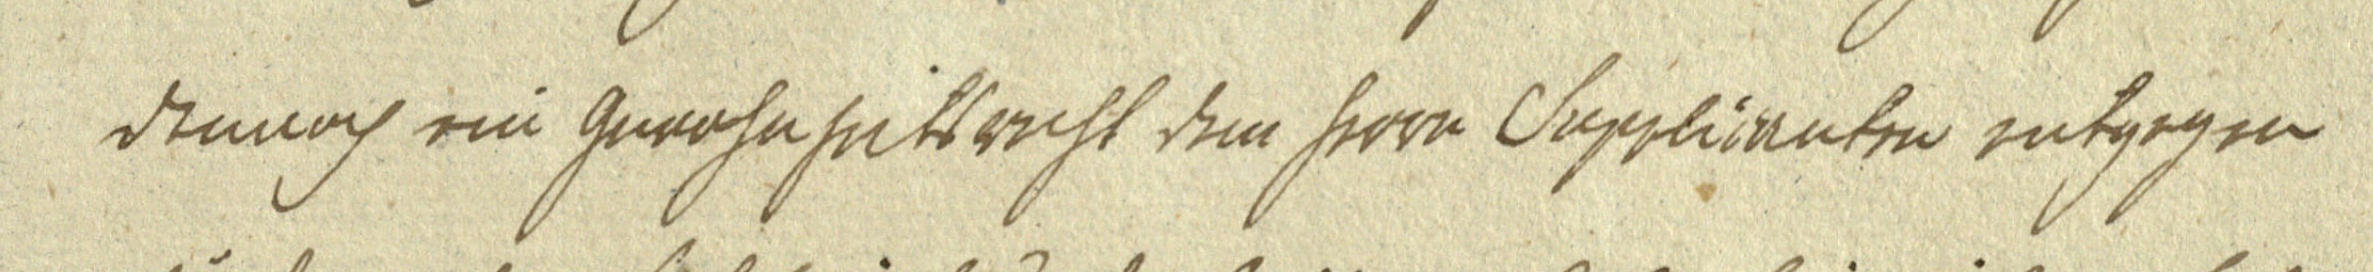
dennoch ein Gwohnheitsrecht dem Herrn Supplicanten entgegen
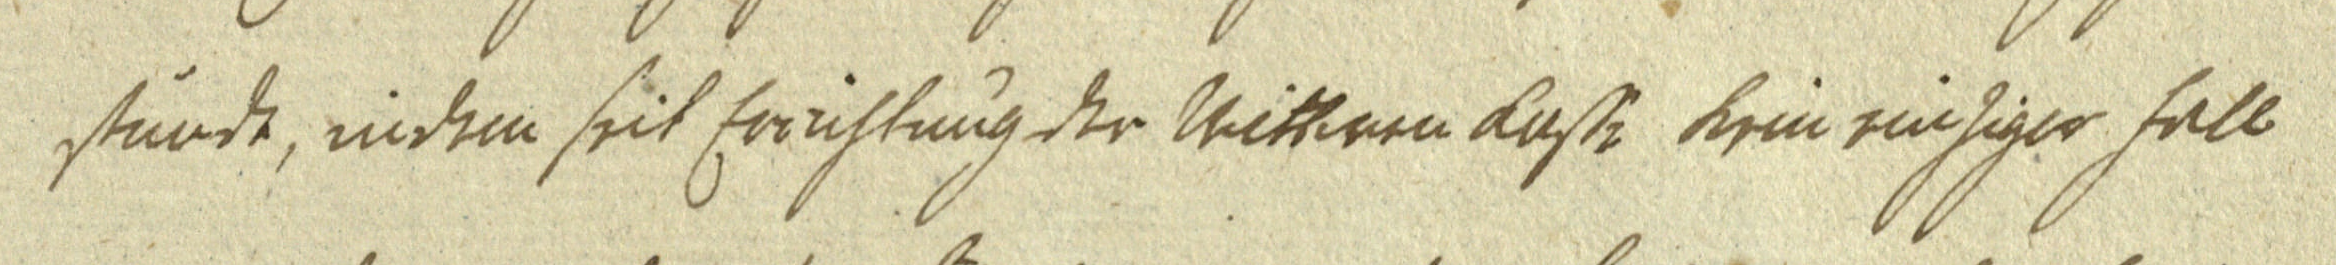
stünde, indem seit Errichtung der Wittwen Kasse kein einziger Fall
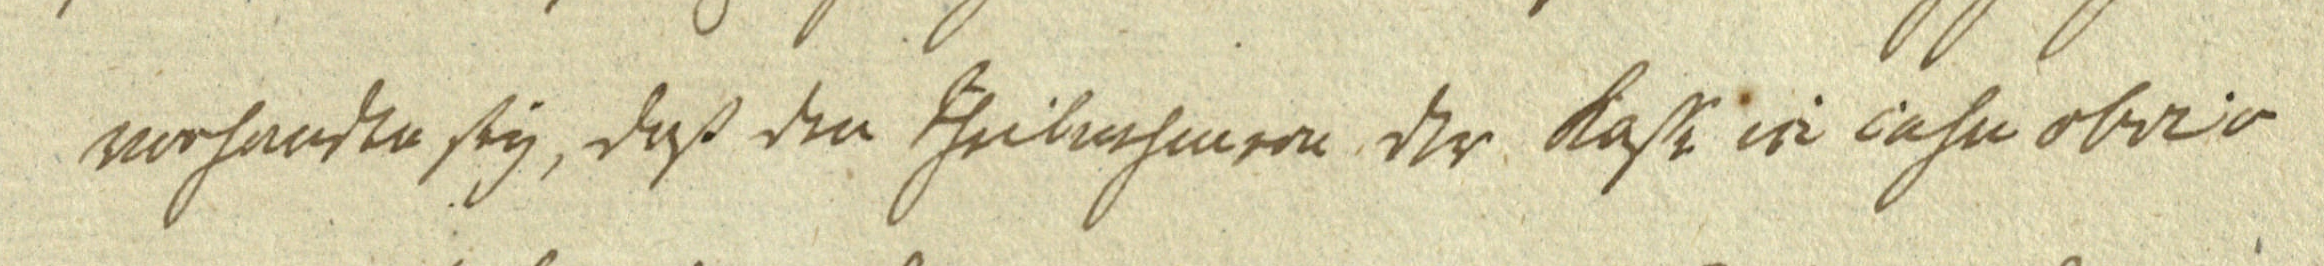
vorhanden seÿ, daß den Theilnehmern der Kasse in casu obrio
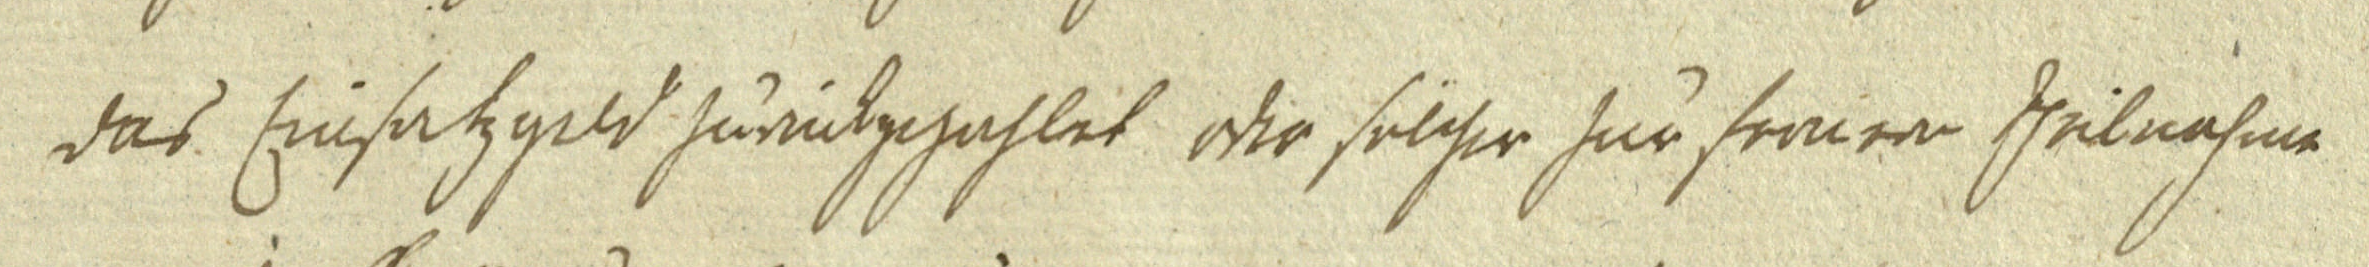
das Einsatzgeld zurückgezahlet oder solcher zur fernern theilnahme
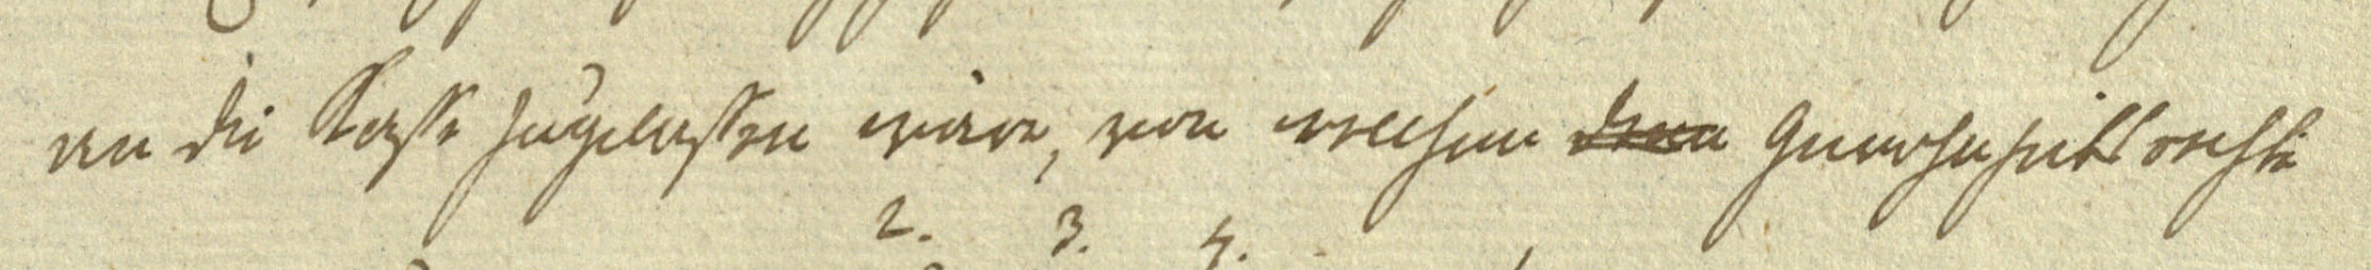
an die Kasse zugelassen wäre, von welchem denn Gewohnheitsrechte
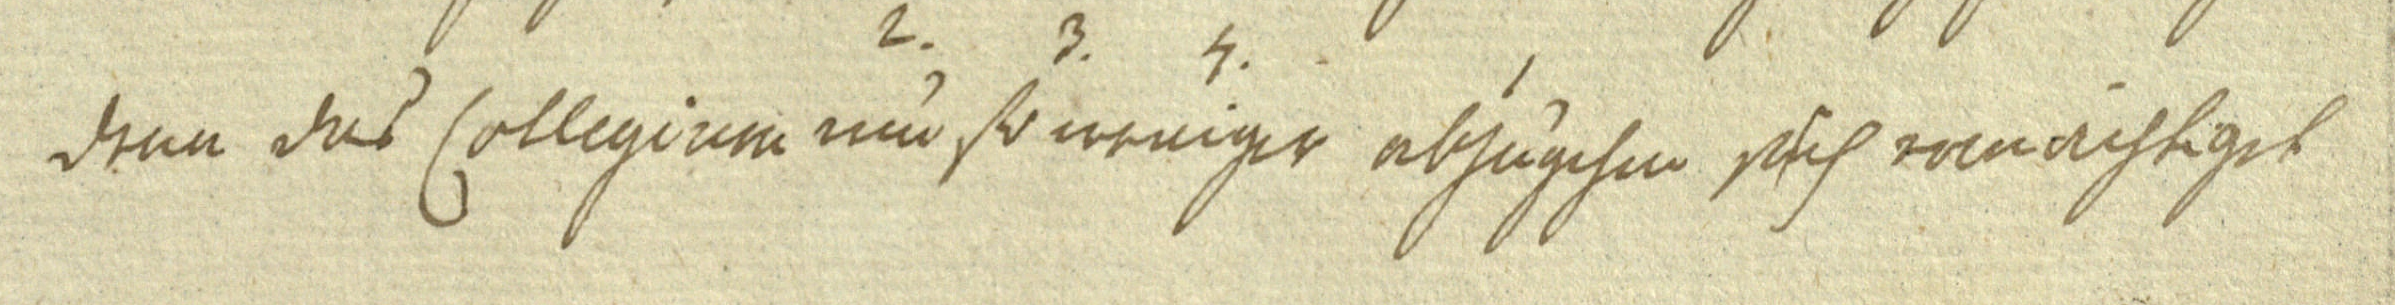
denn das Collegium um so weniger abzugehen sich ermächtiget
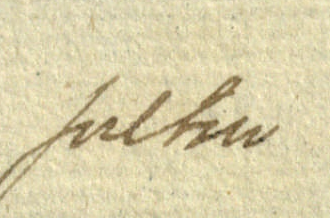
halten
